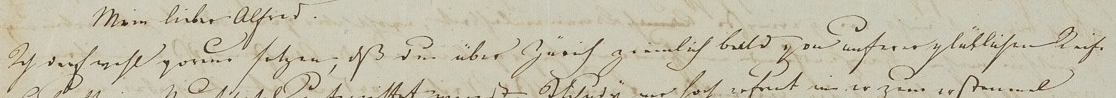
Ich darf wohl voraus setzen, dß du über Zürich ziemlich bald von unserer glüklichen Reise
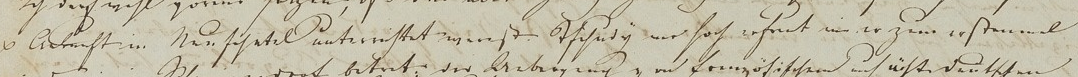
& Ankunft in Neuschatel unterrichtet warest. Tschudy war hoch erfreut wie er zum erstenmal
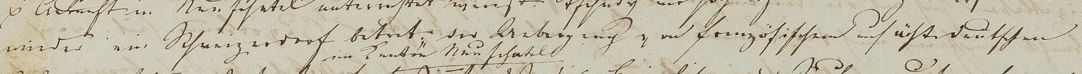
wieder ein Schweizerdorf betrat; der Uebergang von französischem auf ächt deutschen
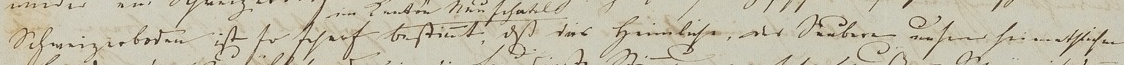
scharf im Kanton Neuschatel bestimmt, dß das Heimliche, das Saubere unserer heimathlichen
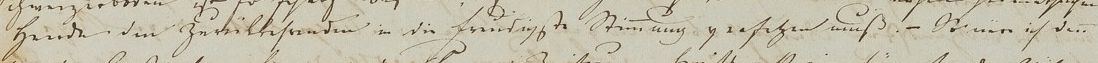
Heerde den Zurükkehrenden in die freudigste Stimmung versetzen muß. – So wäre ich denn
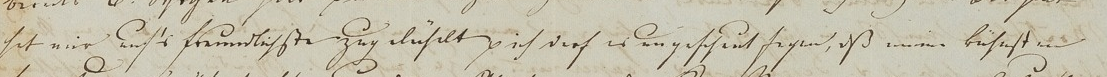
hat mir auf's freundlichste zugelächelt & ich darf es ungescheut sagen, dß meine kühnsten
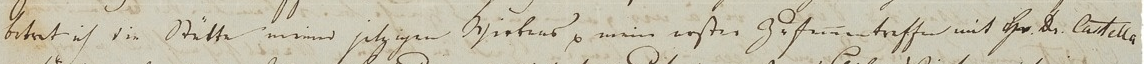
betrat ich die Stätte meines jetzigen Wirkens & mein erstes Zusammentreffen mit Hr. Dr. Castella
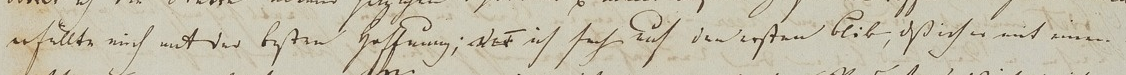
erfüllte mich mit der besten Hoffnung; denn ich sah auf den ersten Blik, dß ich es mit einem
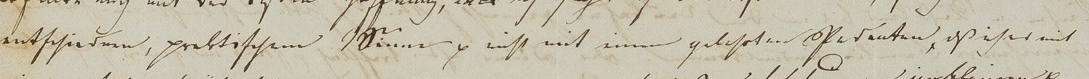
entschiednen, praktischen Sinne & nicht mit einem gelehrten Pedanten, dß ich es mit
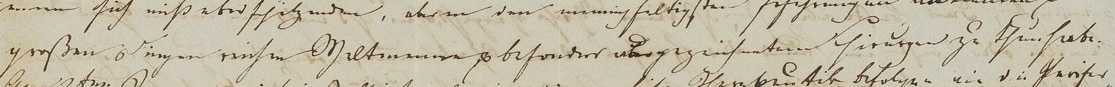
großen Dingen reichen Weltmanne & besonders ausgezeichneten Chirurgen zu thun habe.
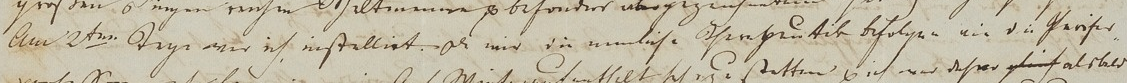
Am 2ten Tage war ich installirt. Da wir die nemliche Therapeutik befolgen wie die Pariser -
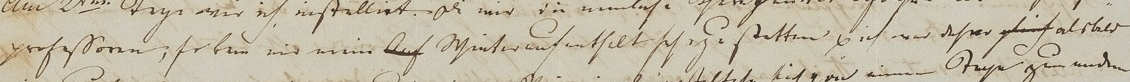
professoren, so kam mir mein Auf Winteraufenthalt sehr zu statten & ich war daher gleich alsbald
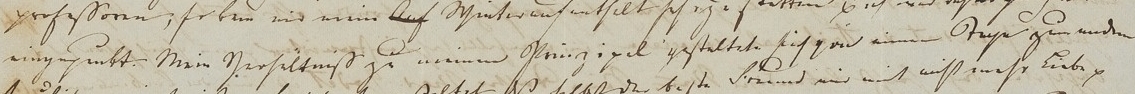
eingepaukt. Mein Verhältniss zu meinem Prinzipal gestaltete sich von einem Tage zum andern
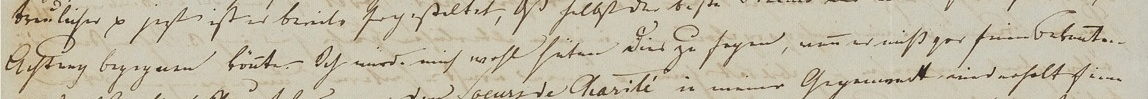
Achtung begegnen könnte. Ich würde mich wohl hüten dies zu sagen, wenn er nicht vor seinen Bekannten
